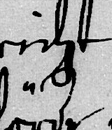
e.
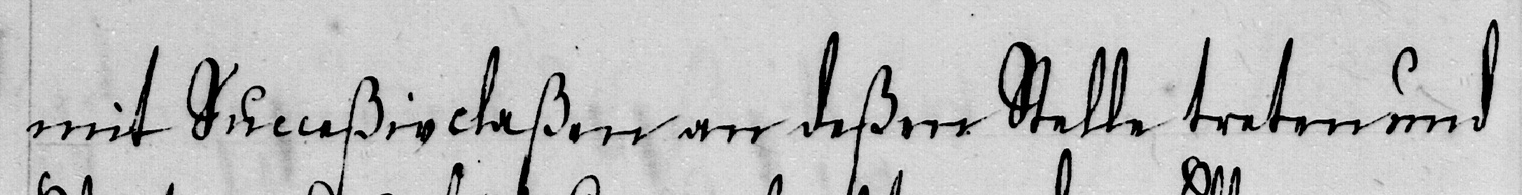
mit Succeßivclaßen an deßen Stelle treten und
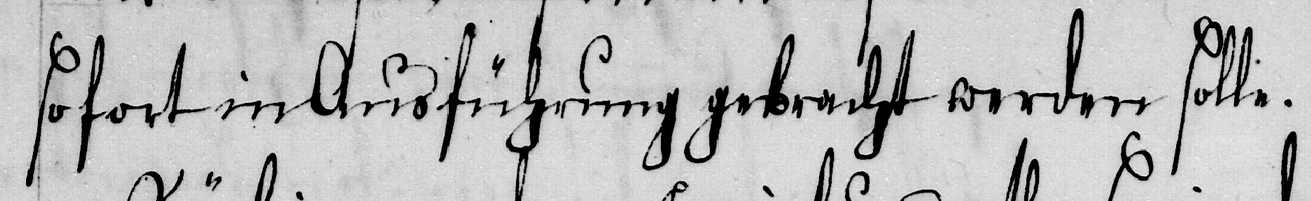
sofort in Ausführung gebracht werden soll¬
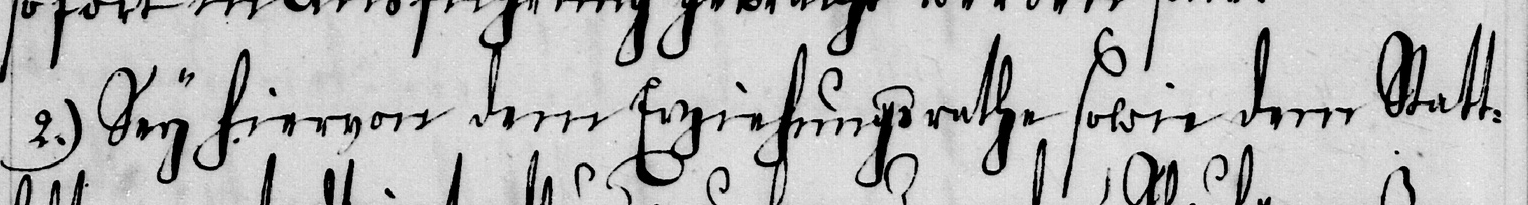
2.) Sey hiervon dem Erziehungsrathe sowie dem Statt¬
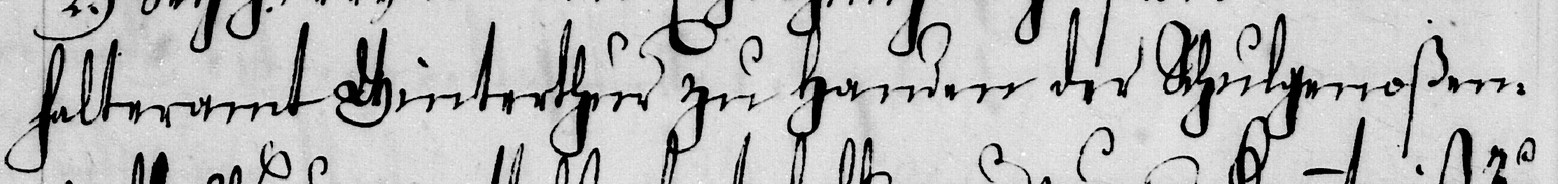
halteramte Winterthur zu Handen der Schulgenoßen¬
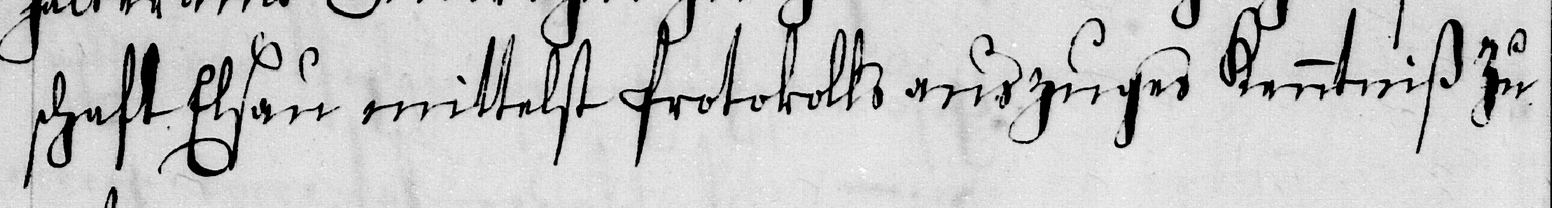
schaft Elsau mittelst Protokollsauszuges Kenntniß zu
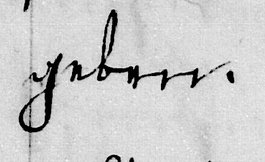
geben.
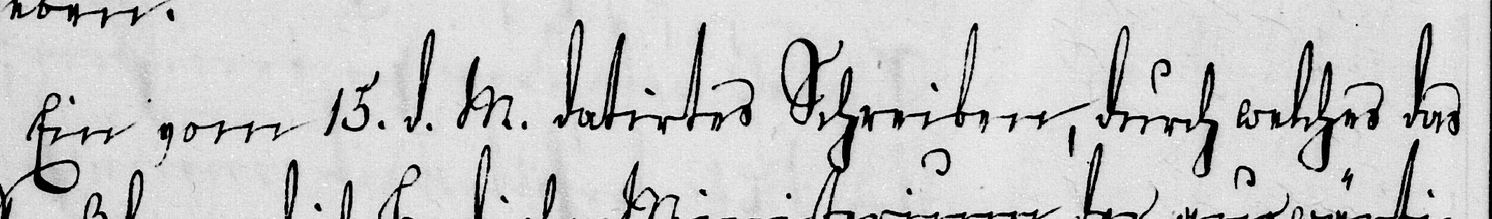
Ein vom 15. d. M. datirtes Schreiben, durch welches das
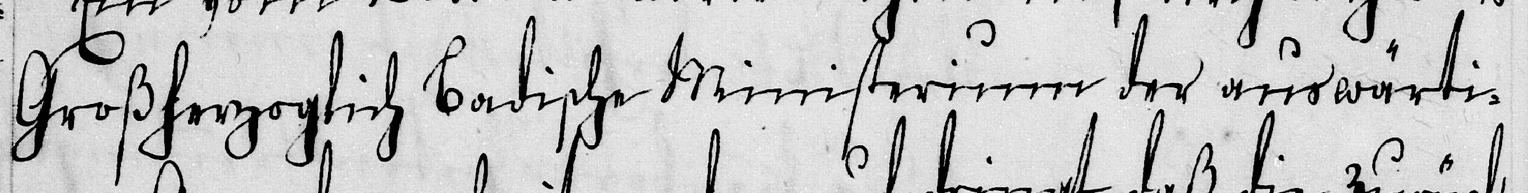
Großherzoglich Badische Ministerium der auswärti¬
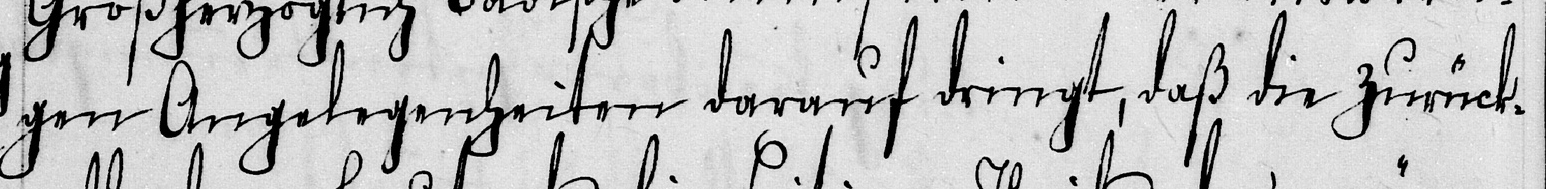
gen Angelegenheiten darauf dringt, daß die zurück¬
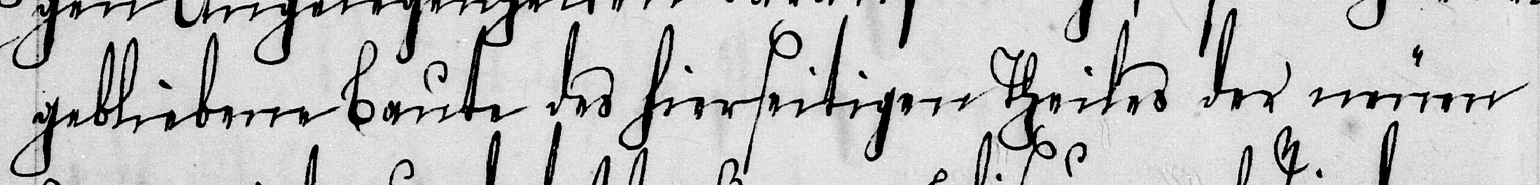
gebliebene Baute des hierseitigen Theils der neuen
